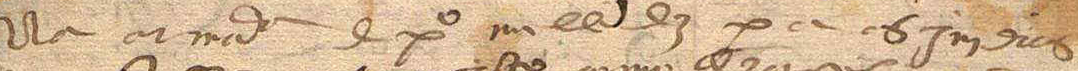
Na armada de po mellēdez ꝑa as Jmdias
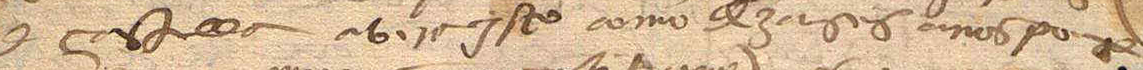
de castella avera Jsto como dezaseis anos pouco
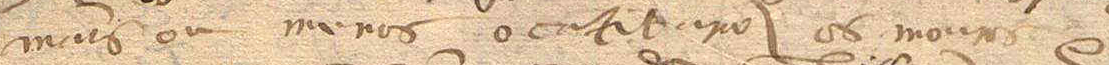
mais ou menos o cativaraõ os mouros e
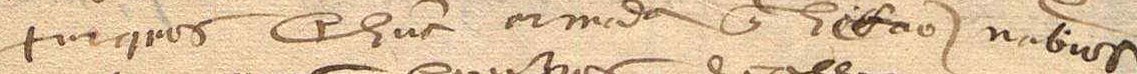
turquos ē huā armada q̄ heRaõ navios
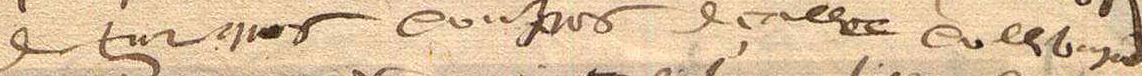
de turquos e outros de çallee e o llevaraõ
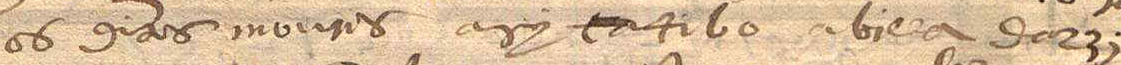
os ditos mouros asy cativo a villa darzj
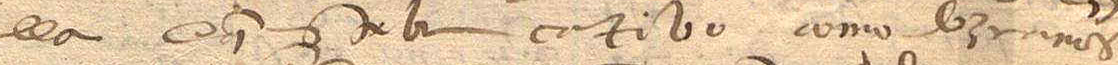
lla e q̄ esteve cativo como doze anos
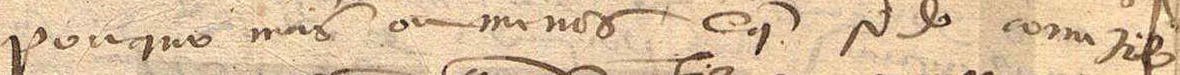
pouquo mais ou menos e q̄ sēdo cometido
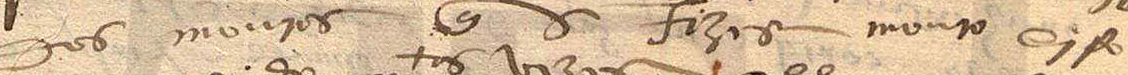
dos mouros q̄ se fizera mouro e jsto
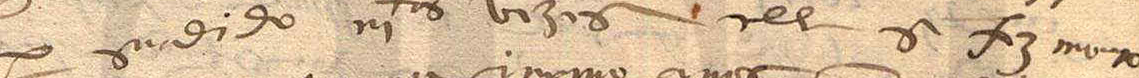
ꝑsuadido mtas vezes elle se fez mouro
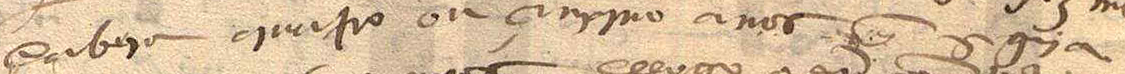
e avera quatro ou çinquo anos q̄ seguia
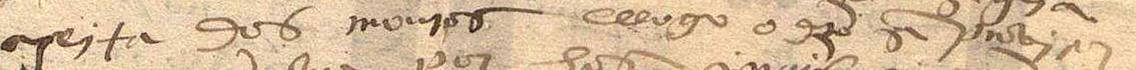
a seita dos mouros e llogo o dtō sr̄ provisor
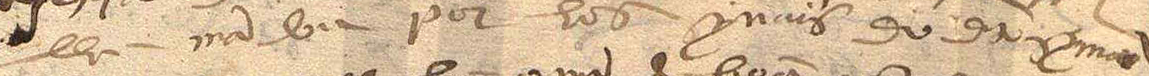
lhe mādou por hos synais do dito symaõ
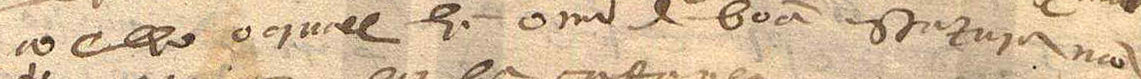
coelho o quall he omē de boā estatura naõ
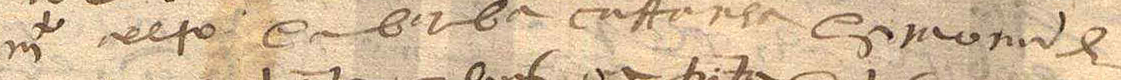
mto allto e a barba castanha e sera omē de
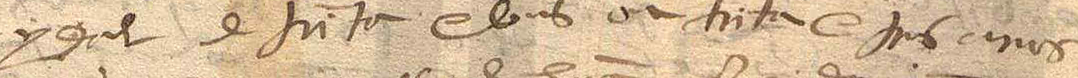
ydade de trīta e dous ou trīta e tres anos
